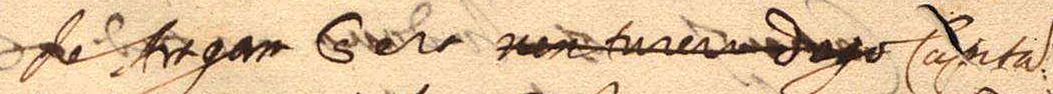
de Aragam q̄ era uentureiro digo Capitā
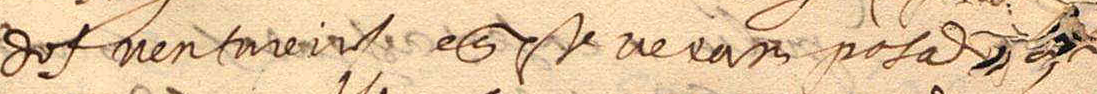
dos uentureiros e q̄ este ueram pasado _
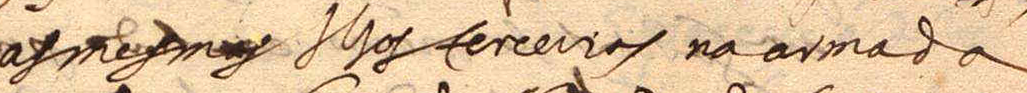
as mesmas Jlhas terceiras na armada
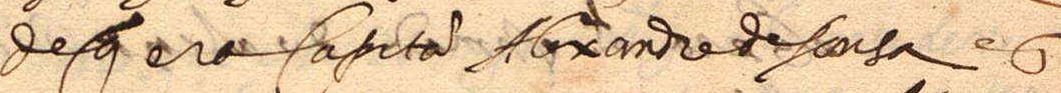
de q̄ era Capitā Alexandre de sousa e q̄
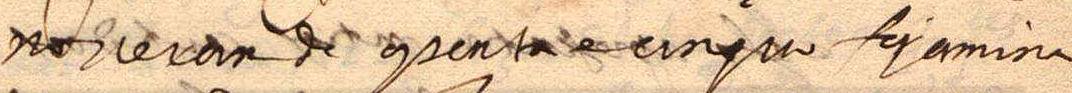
no ueran de ojtenta e cinquo foy a mina
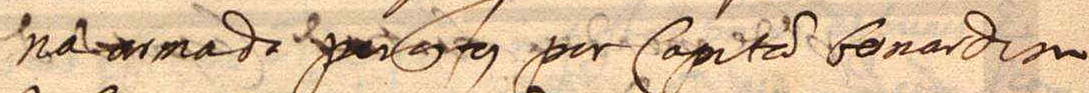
na armada per q̄ foj por Capitā bernardim
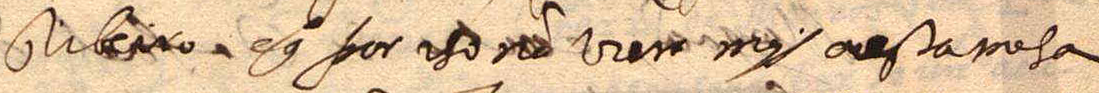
Ribeiro e q̄ por iso nā viera majs a esta mesa
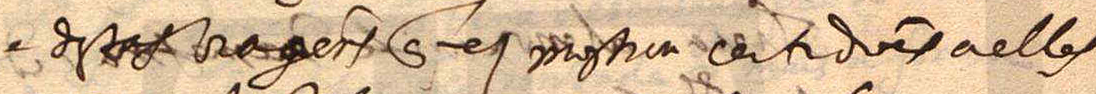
e destas viagens q̄ fes mostrou certidoẽs a elles
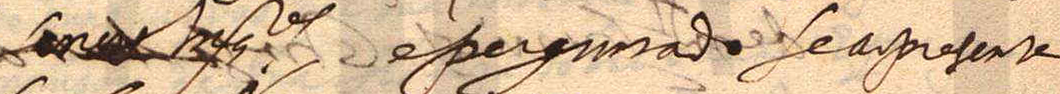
senors Inq.res e perguntado se ao presente
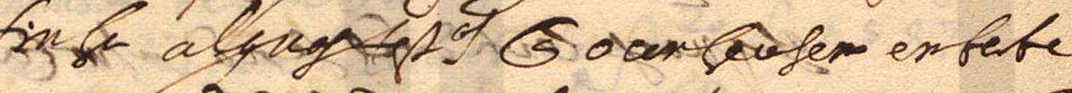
tinha alguas testas q̄ o conhecesem em berbe
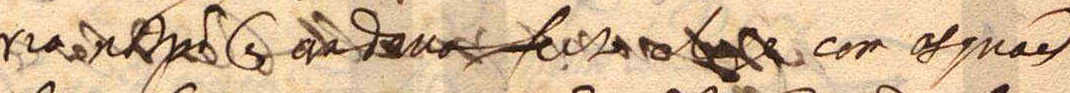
ria no tpō q̄ andaua feito elche com as quaēs
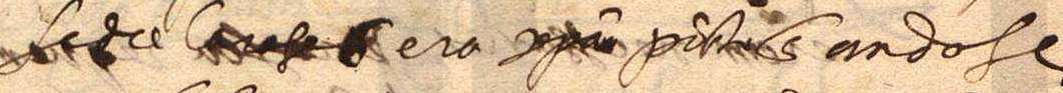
se declarase q̄ era xpão posto q̄ andase
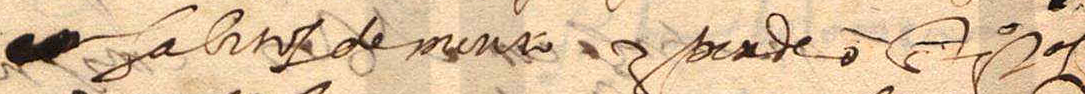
com habitos de mouro respondeo q̄ testas
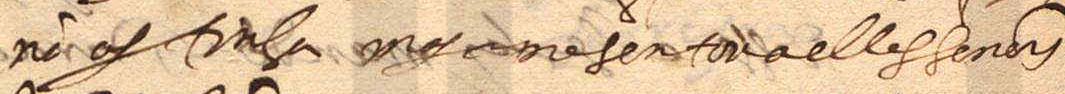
nā as tinha mas apresentou a elles senors̄
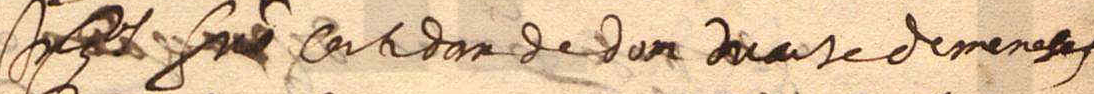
Jnqres huā certidam de dom duarte de meneses
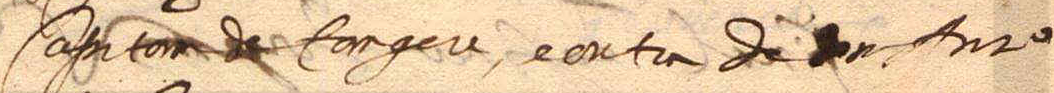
Capitam de tangere, e outra de dom Anto
